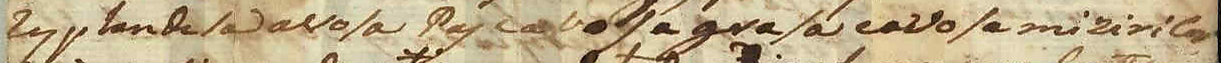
Resplandesa a vosa Pas e a vosa grasa e a vosa miziricor
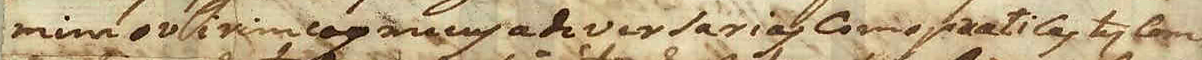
mim o vê vim e os meus adeversarios Como praticas tes Com
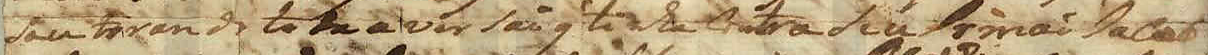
seutirando toda a versaõ q̄ tinha Contra seu Irmaõ Iacob
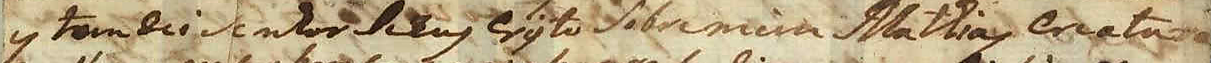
estamdei[?] Senhor Iezus Cristo sobre mim Mathias Criatura
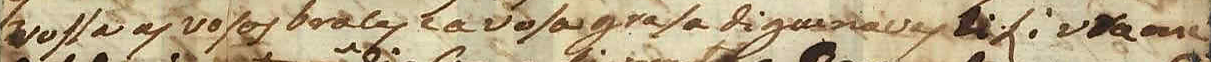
vossa as vosos bracos e a vosa grasa diguenavas diló vVa me
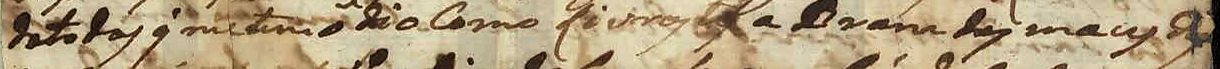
da todas q̄ metem odio Como Livrastes a Dram[?] das maies dos
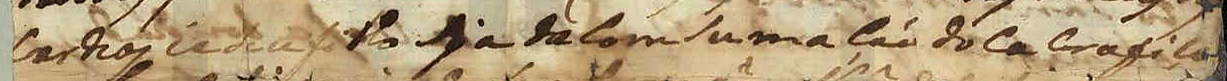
Cardos i a seu filho Sja da ComsumaÇaõ do Ca Crafiça
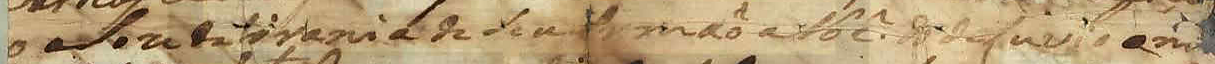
o a Ioze da tirania de Seu Irmaõ a Noê do deLuvio a n
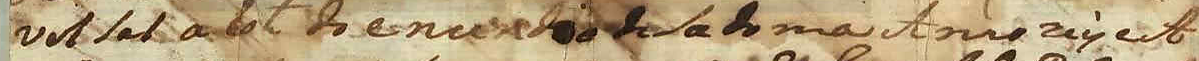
vel ser a Lot do emundo de Sadoma Anno zeis e A
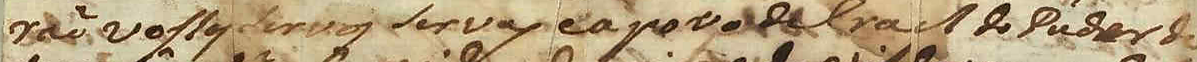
raõ vossos servos servas e a povo de lrael do Puder de
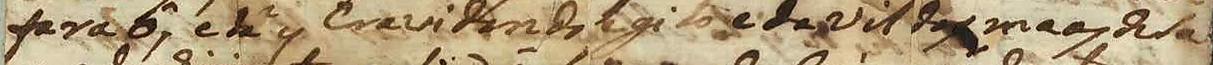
faraó, e dá esCravidando Egito e da vil das maos de sa
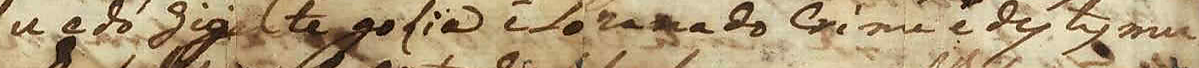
u e do Gigante golia ē sozana do Crime e destes mu
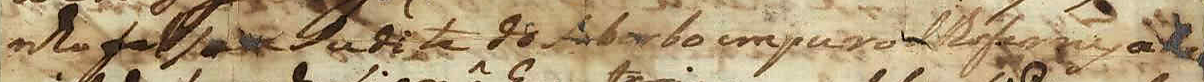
nho falsa a Iudite do soberbo empuro de lhofernes a Da
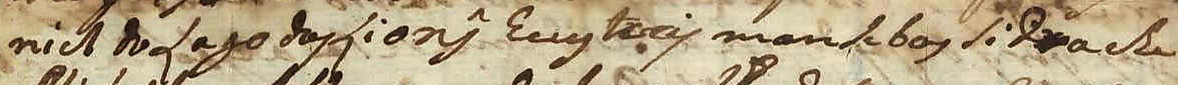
niel do Lago dos Lions E nos treis mansebos Sidrache
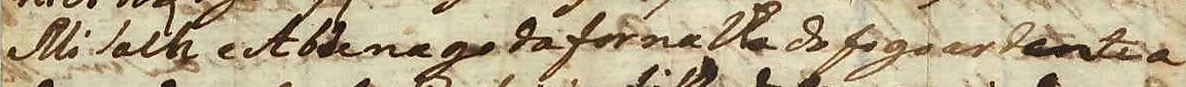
Misach e Abdenago da fornalha do fogo ardente a
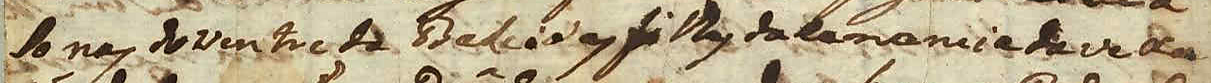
Ionas do ventre da Baleia as filhas da cananeia da vexa
